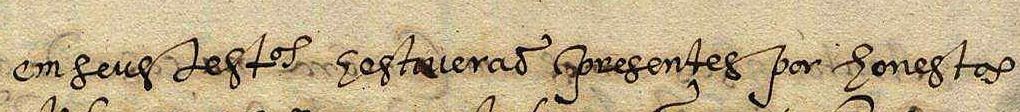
em seus testos E estiueraõ presentes por honestas
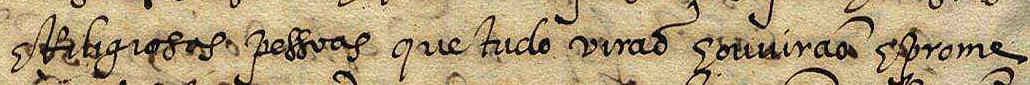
E Religiosas pessoas que tudo viraõ E ouuiraõ E prome
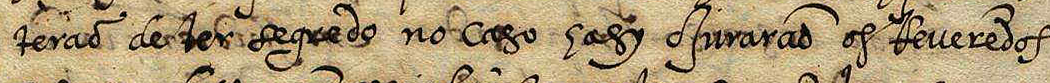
teraõ de ter segredo no caso E asy o Juraraõ os Reuerēdos
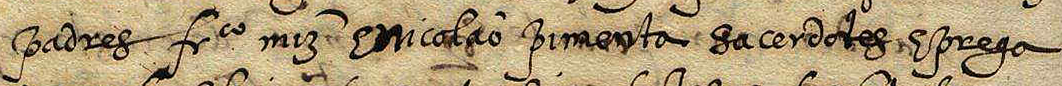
padres frco miz̄ E nicolao pimenta sacerdotes E prega
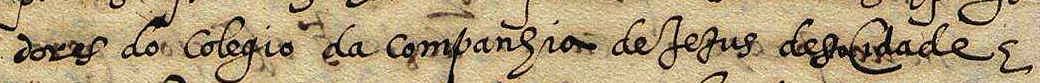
dores do colegio da companhia de Jesus desta Cidade E
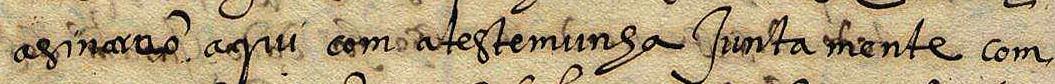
asinaraõ aqui com a testemunha Juntamente com
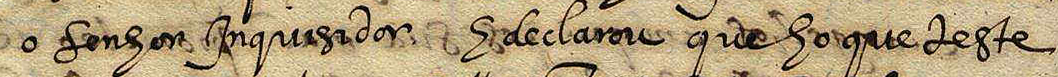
o senhor Jnquisidor E declarou que ho que teste
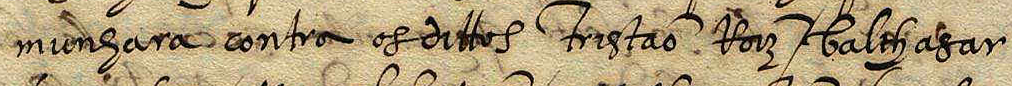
munhara contra os dittos tristaõ Roiz̄ / balthasar
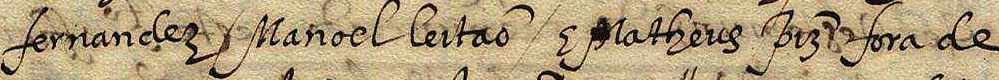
fernandez / Manoel leitaõ / E Matheus piz̄ fora de
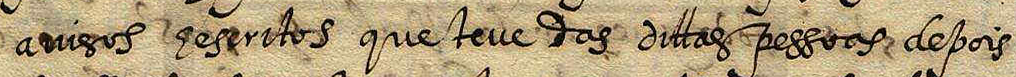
auisos E escritos que teve das dittas pessoas depois
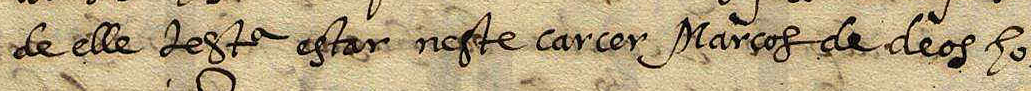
de elle testa estar neste carcer Marcos de deos ho
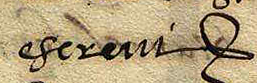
escreui
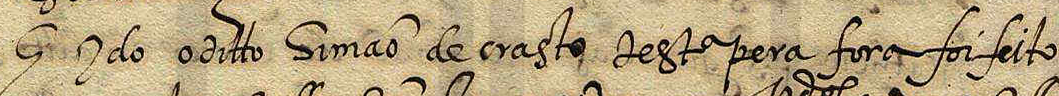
E jdo o ditto Simaõ de crasto testa pera fora foi feito
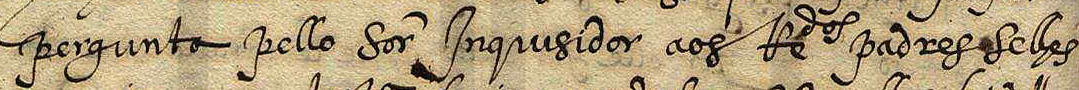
pergunta pello Sor̄ Jnquisidor aos Redos padres se lhes
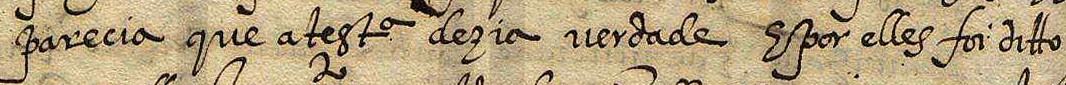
parecia que a testa dezia uerdade E por elles foi ditto
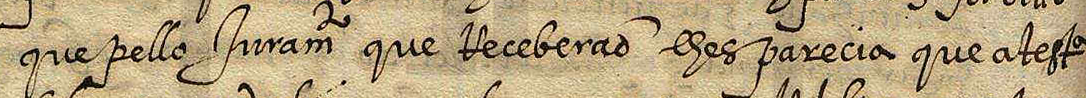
que pello Juramto que Receberaõ lhes parecia que a testa
